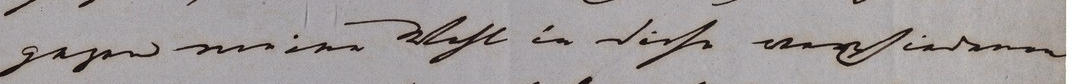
gegen meine Wahl in diese verschiedenen
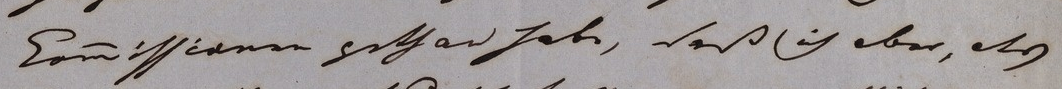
Commissionen gethan habe, daß ich aber, als
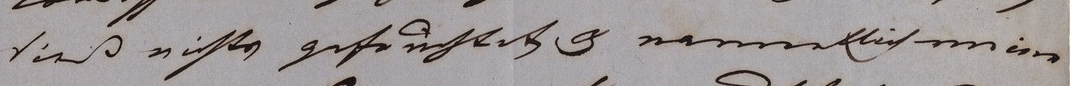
dieß nichts gefruchtet & namentlich meine
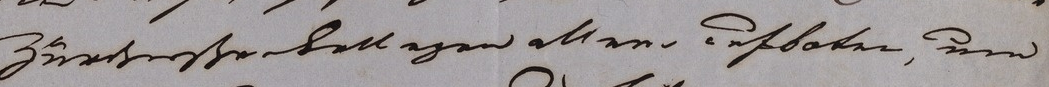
Zürcherschen Collegen allem aufboten, um
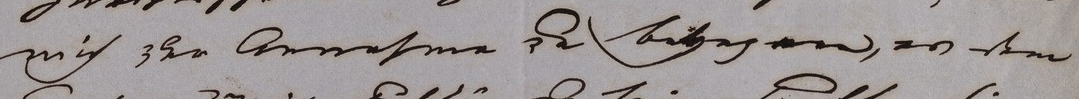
mich zur Annahme zu bewegen, es dem
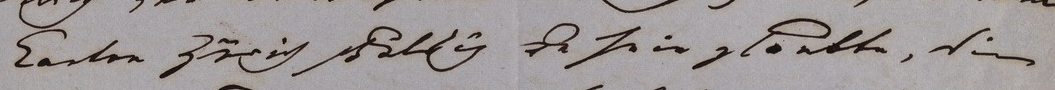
Canton Zürich schuldig zu sein glaubte, die
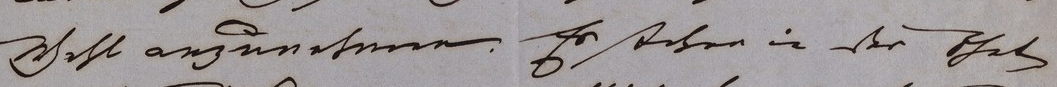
Wahl anzunehmen. Es stehen in der That
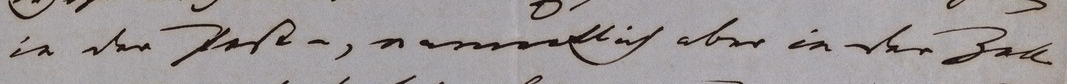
in der Post-, namentlich aber in der Zoll-
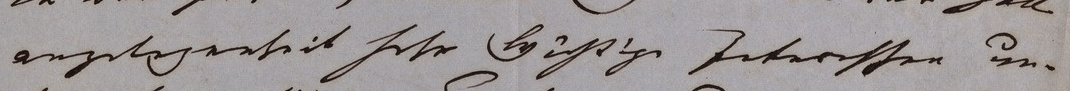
angelegenheit sehr wichtige Interessen un-
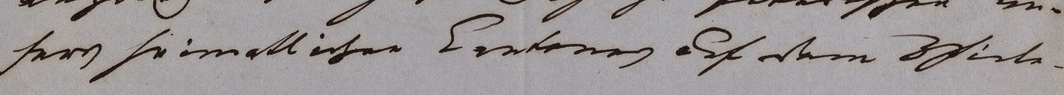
sers heimatlichen Cantones auf dem Spiele.
